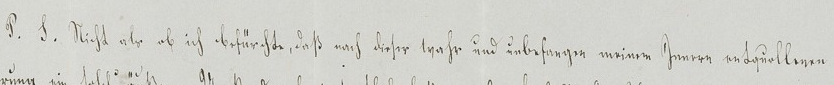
P. S. Nicht als ob ich befürchte, daß nach dieser wahr und unbefangen meinem Innern entquollenen
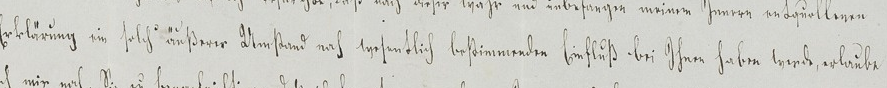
Erklärung ein solch äußerer Umstand noch wesentlich bestimmenden Einfluß bei Ihnen haben werde, erlaube
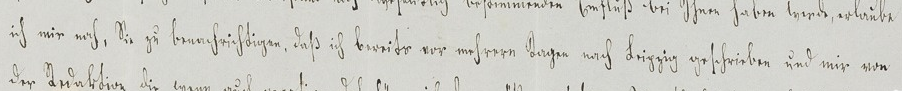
ich mir noch, Sie zu benachrichtigen, daß ich bereits vor mehrern Tagen nach Leipzig geschrieben und mir von
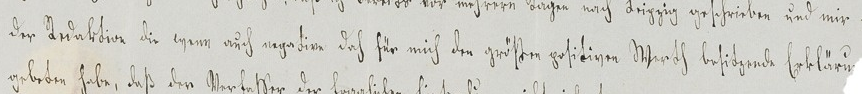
der Redaktion die wenn auch negative doch für mich den grösten positiven Werth besitzende Erklärung
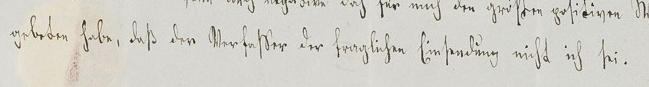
gebeten habe, daß der Verfasser der fraglichen Einsendung nicht ich sei.
